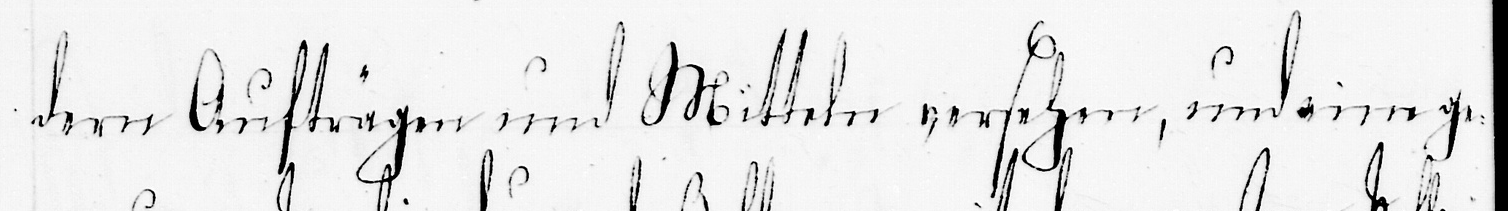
dern Aufträgen und Mitteln versehen, und eine ge¬
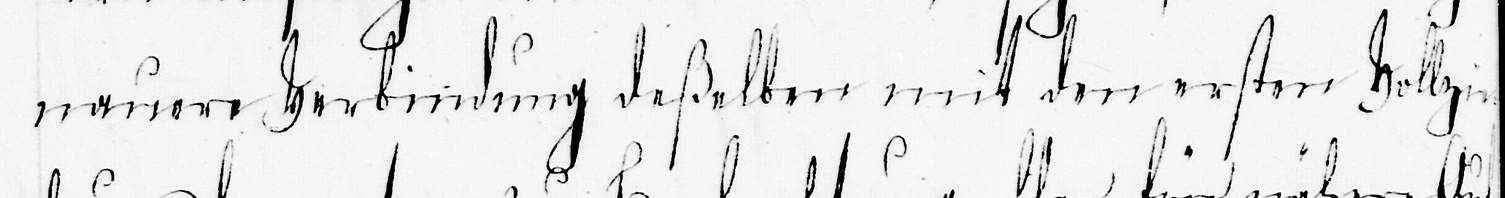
nauere Verbindung deßelben mit den ersten Vollzi¬
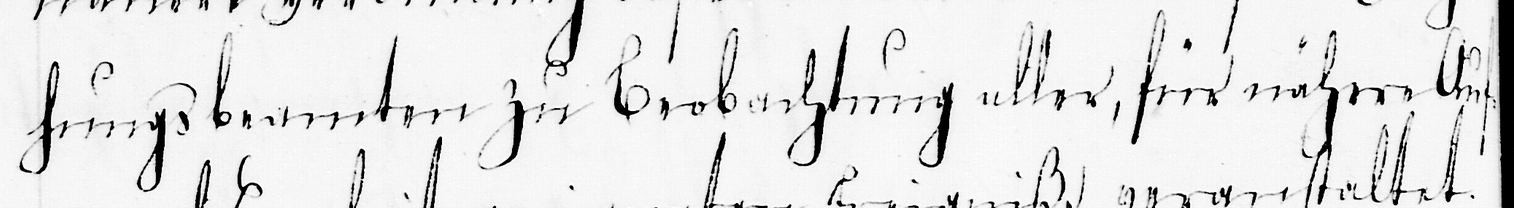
ehungsbeamten zu Beobachtung aller, für nähere Au¬
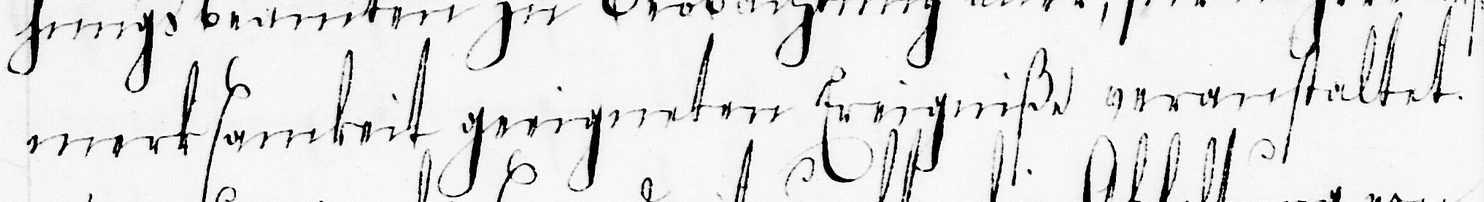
fmerksamkeit geeigneten Ereigniße veranstaltet.
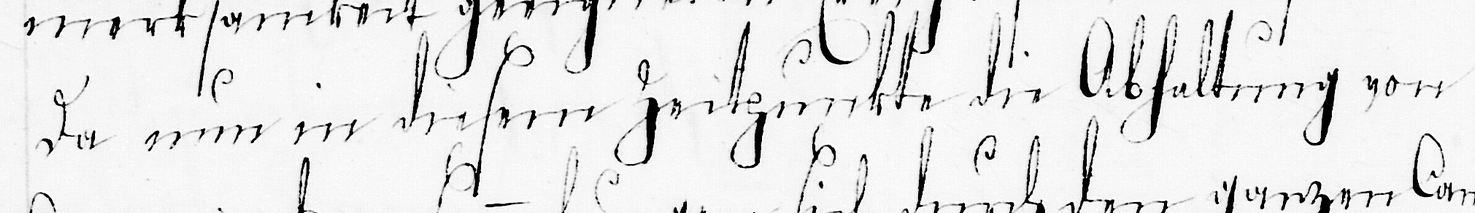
Da nun in diesem Zeitpunkte die Abhaltung von
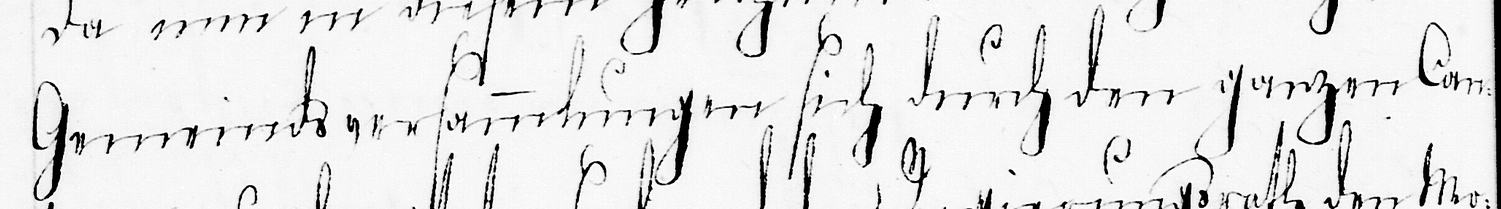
Gemeindsversammlungen sich durch den ganzen Can¬
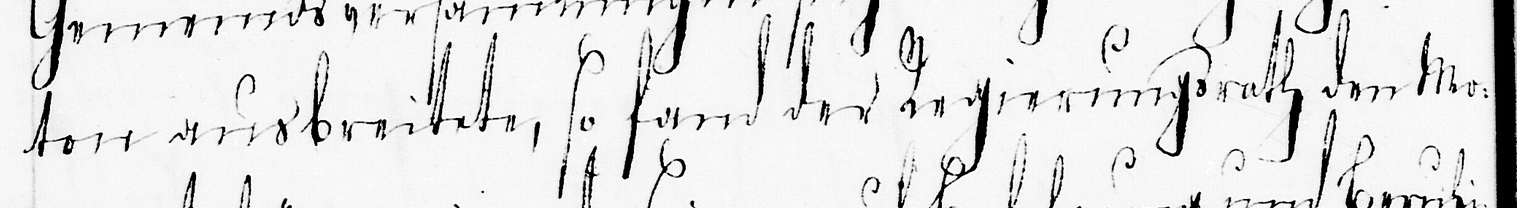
ton ausbreitete, so fand der Regierungsrath den Mo¬
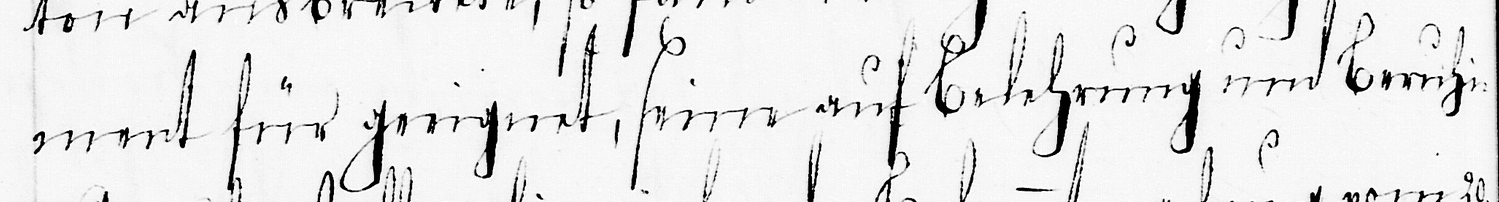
ment für geeignet, seine auf Belehrung und Beruh¬
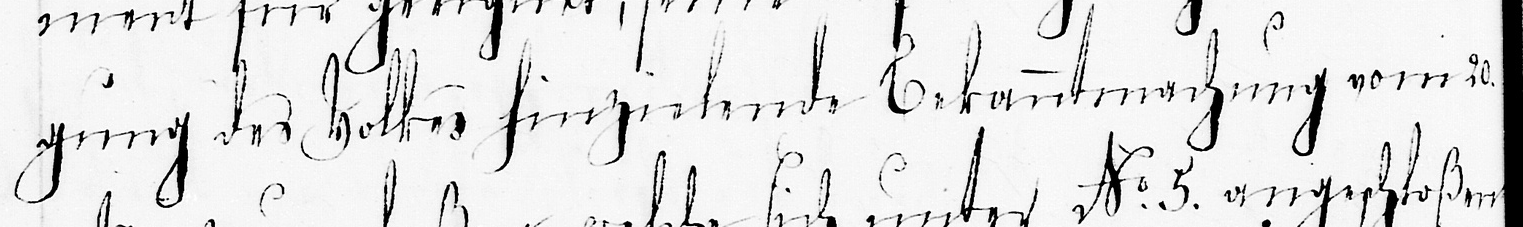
igung des Volkes hinzielende Bekanntmachung vom 20.
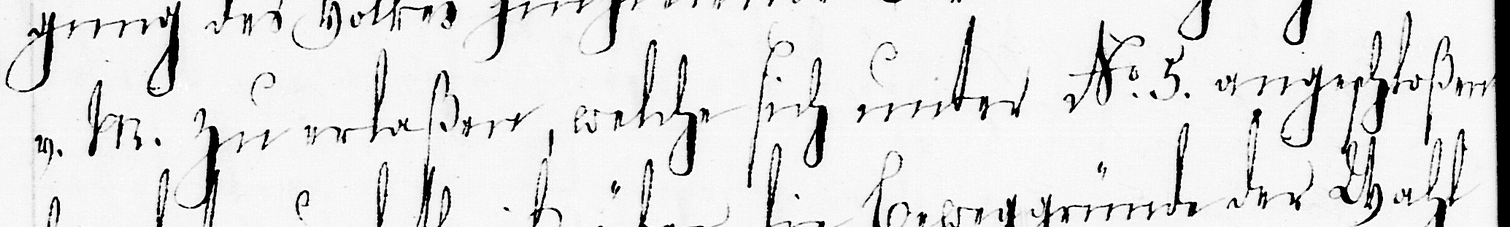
v. M. zu erlaßen, welche sich unter No. 5. angeschloßen
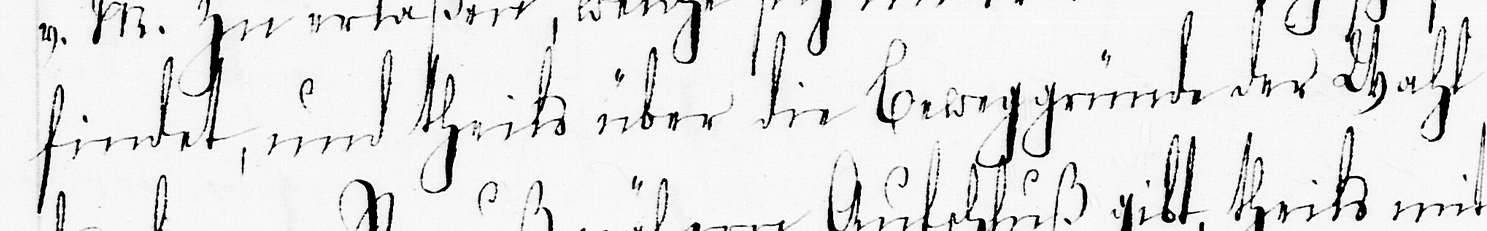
findet, und theils über die Beweggründe der Wahl
